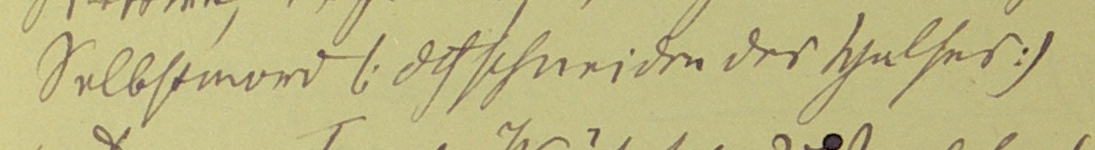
Selbstmord ( : durchschneiden des Halses . )
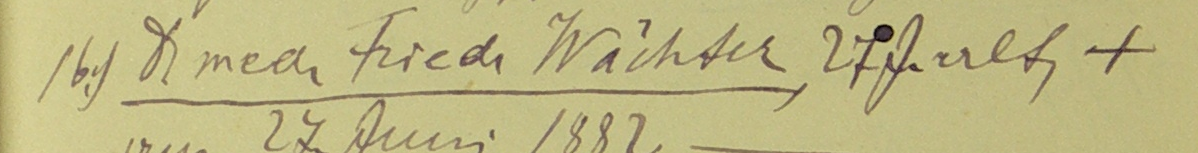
16.) Dr. med. Friedr. Wächter, 27 J. alt +
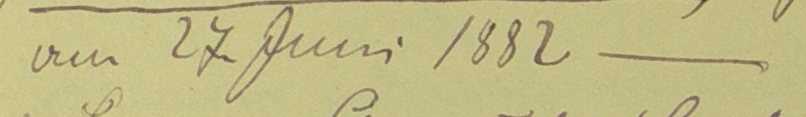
am 27 Juni 82
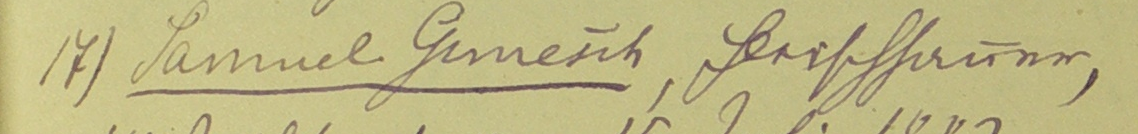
17.) Samuel Gunesch, Fleischhauer,
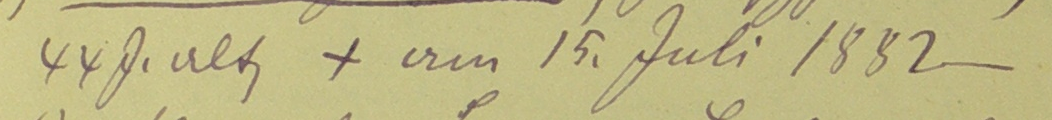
44 J. alt + am 15 Juli 82
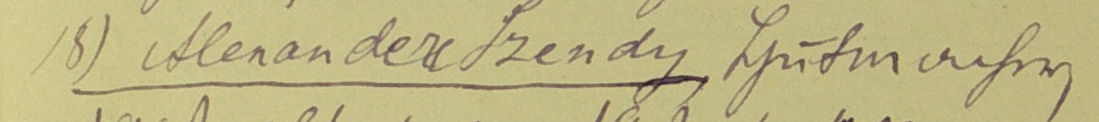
18.) Alenander Szendy, Hutmacher
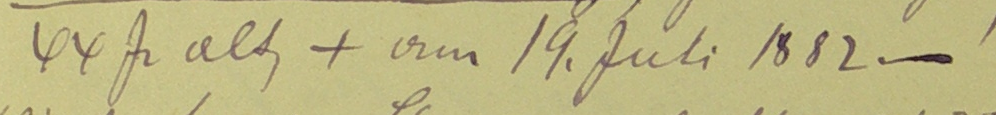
44 J. alt + am 19 Juli 82
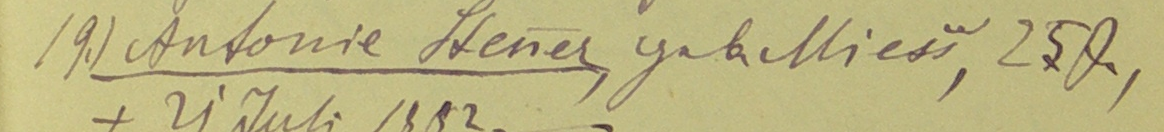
19.) Antonie Stenner, geb. Miess, 25 J. alt
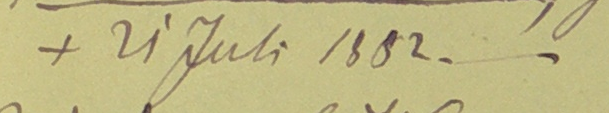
+ am 21 Juli 82
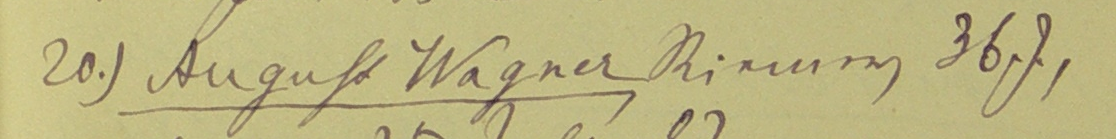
20.) August Wagner, Riemer, 36 J. alt
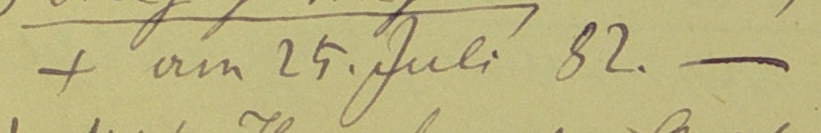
+ 25 Juli 82
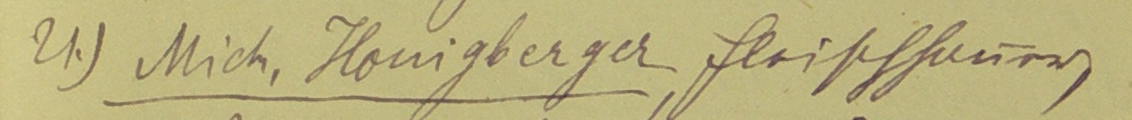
21.) Mich. Honigberger, Fleischhauer,
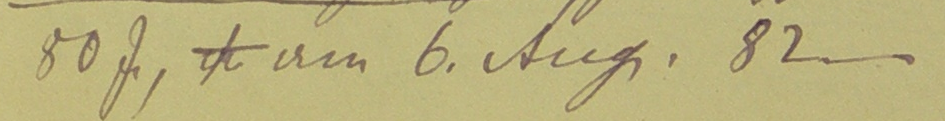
80 J. alt + 6 Aug. 82…
